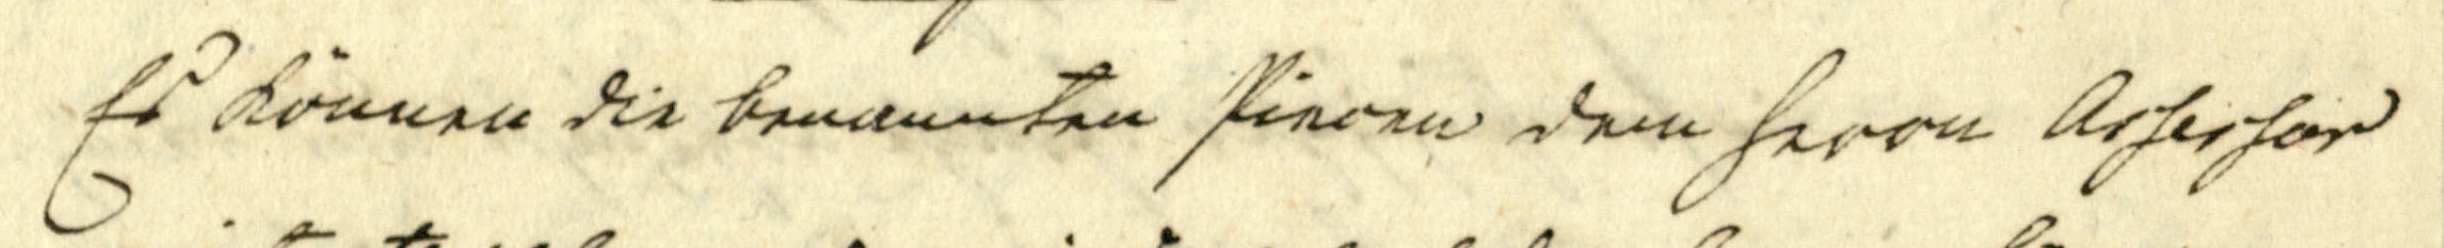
Es können die benannten Piecen dem Herrn Assersor
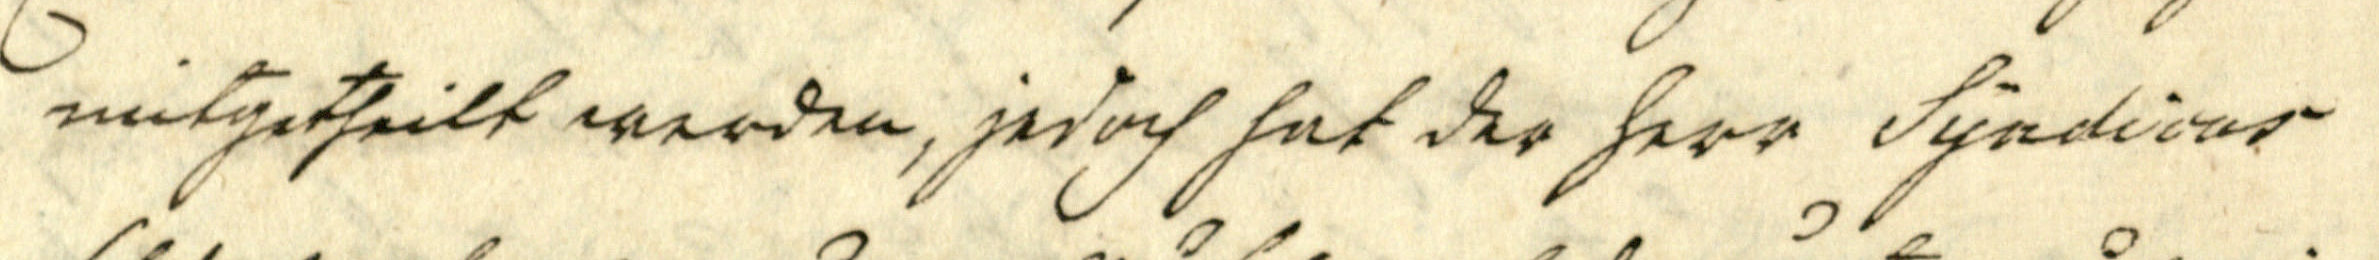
mitgetheilt werden, jedoch hat der Herr Sÿndicus
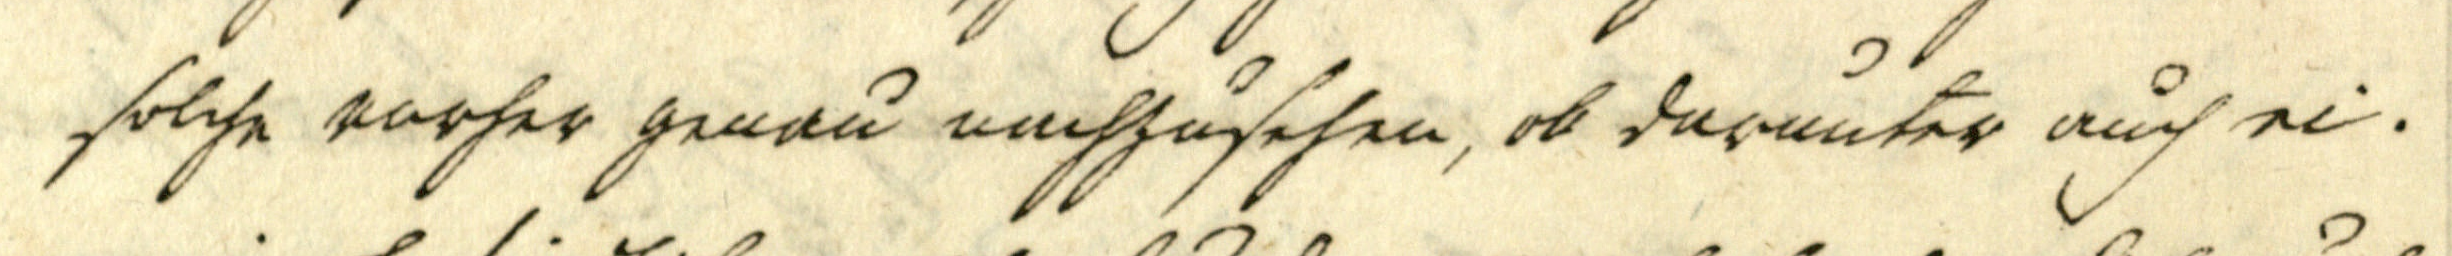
solche vorher genau nachzusehen, ob darunter auch ei¬
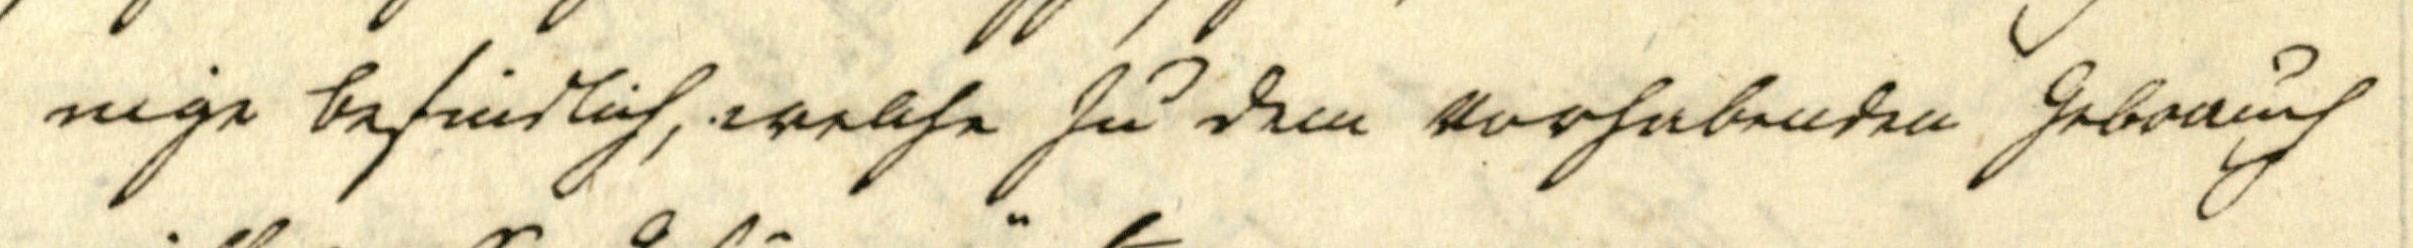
nige befindlich, welche zu dem vorhabenden Gebrauch
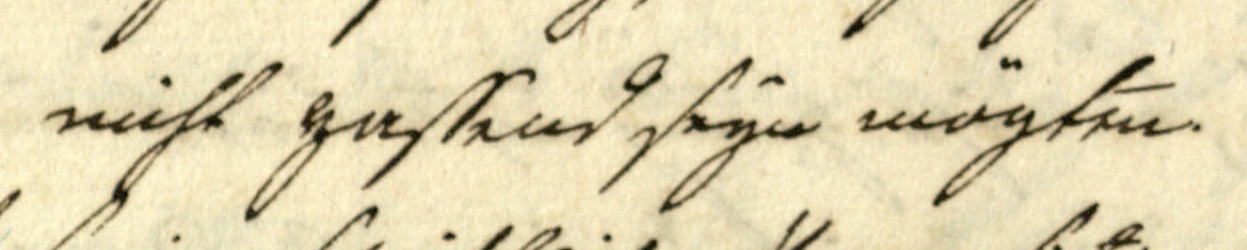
nicht passend seÿn mögten.
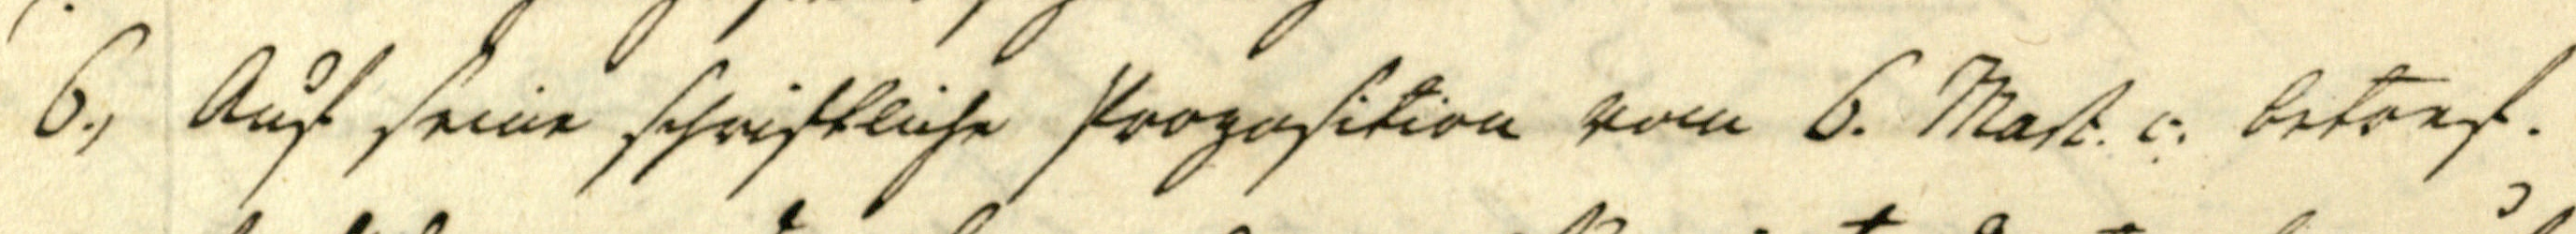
6., Auf seine schriftliche Proposition vom 6. Mart c. betref¬
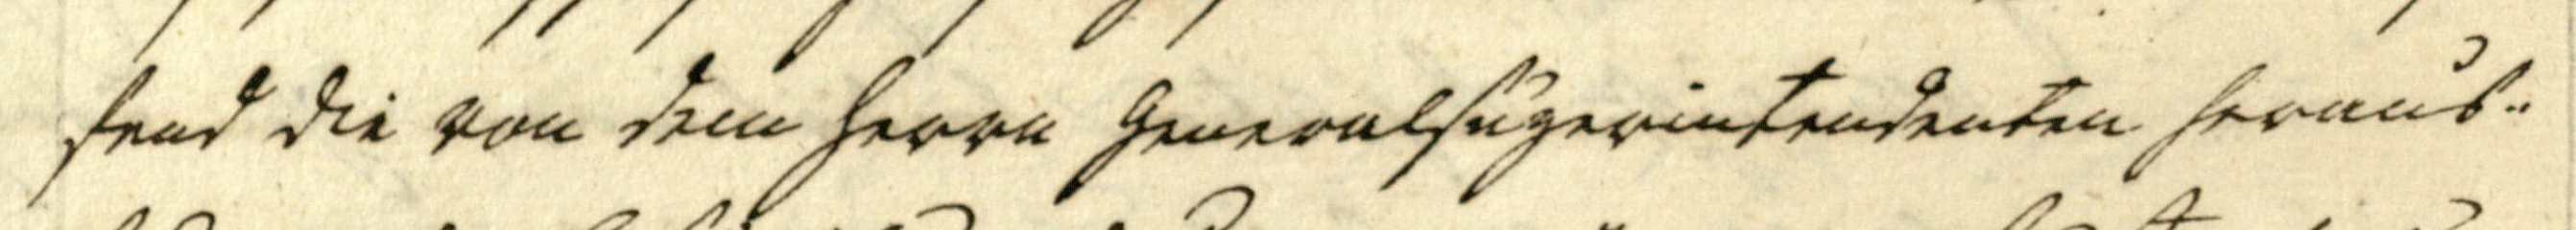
fend die von dem Herrn Generalsuperintendenten heraus¬
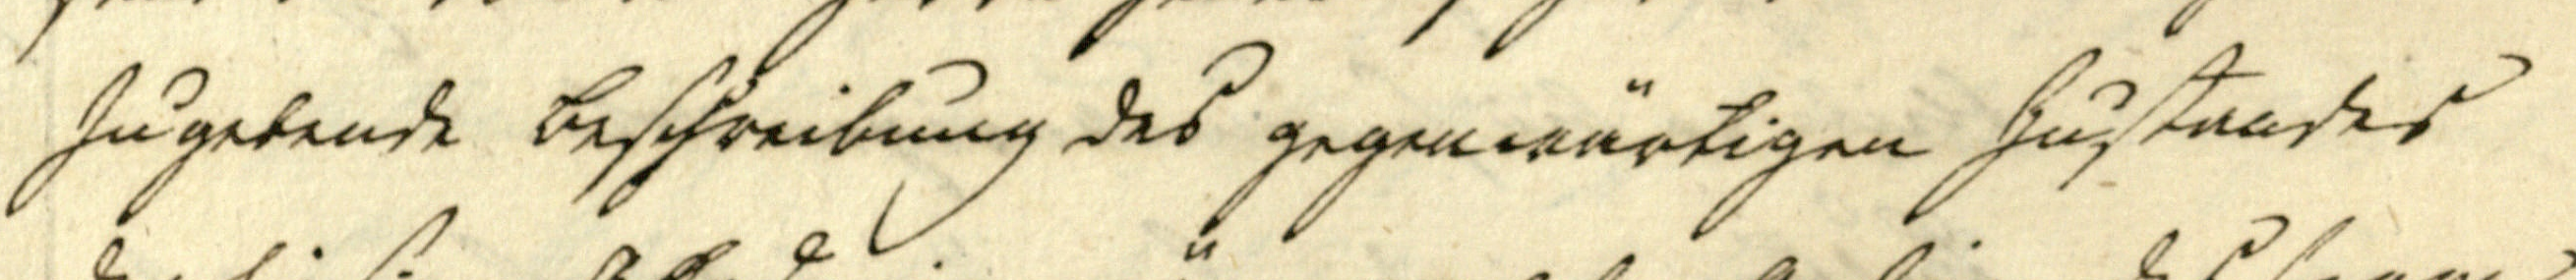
zugebende Beschreibung des gegenwärtigen Zustandes
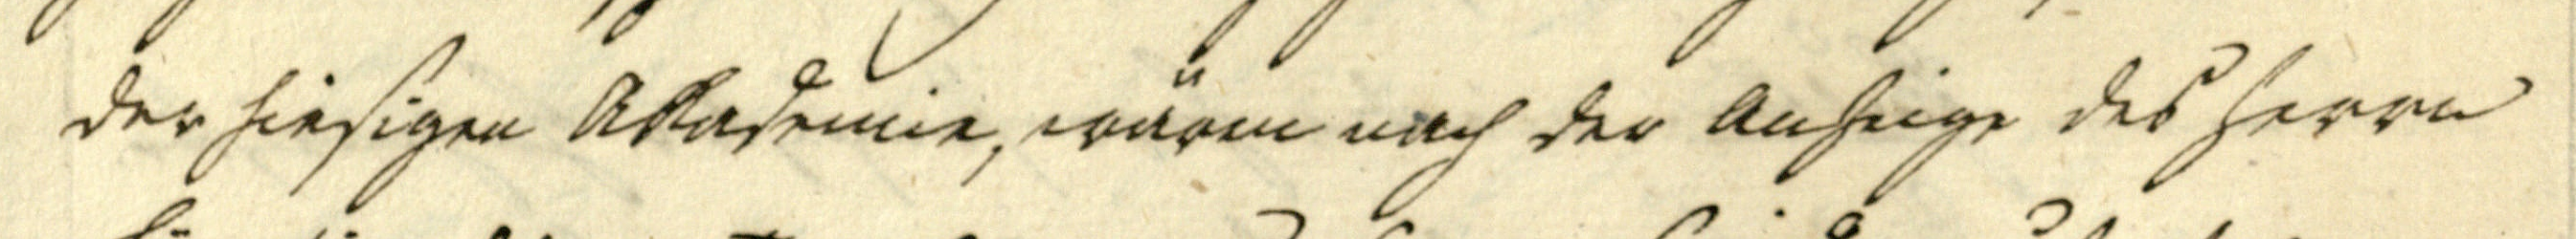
der hiesigen Akademie, wären nach der Anzeige des Herrn
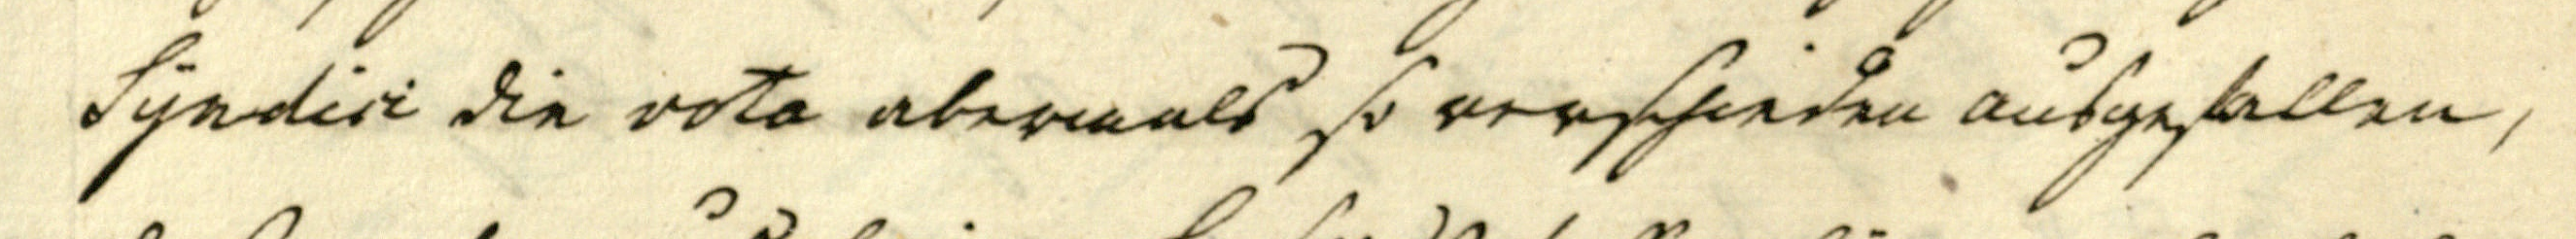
Sÿndici die vota abermals so verschieden ausgefallen,
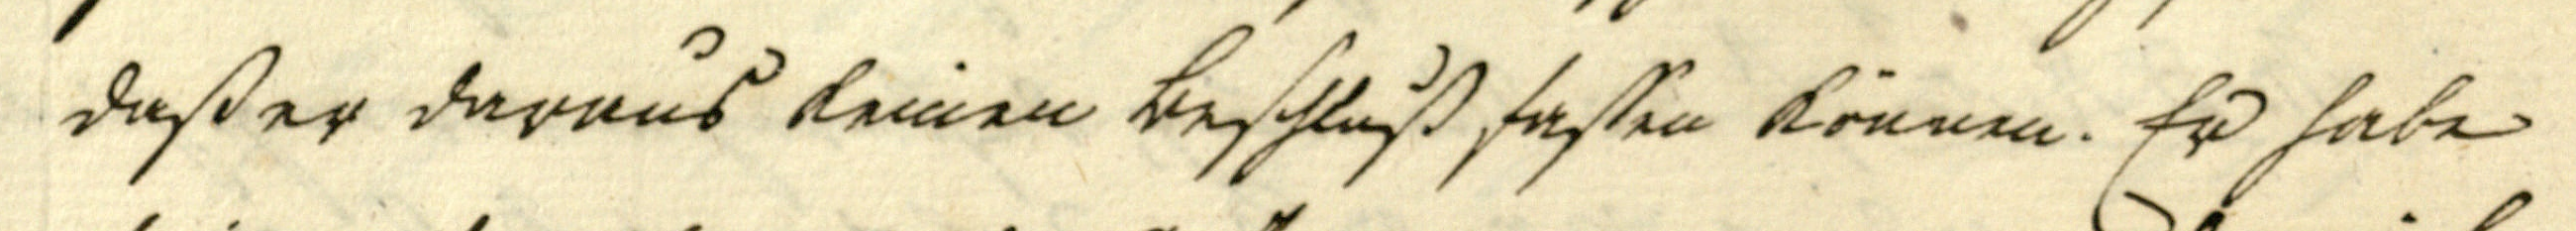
daß er daraus keinen Beschluß fassen können. Er habe
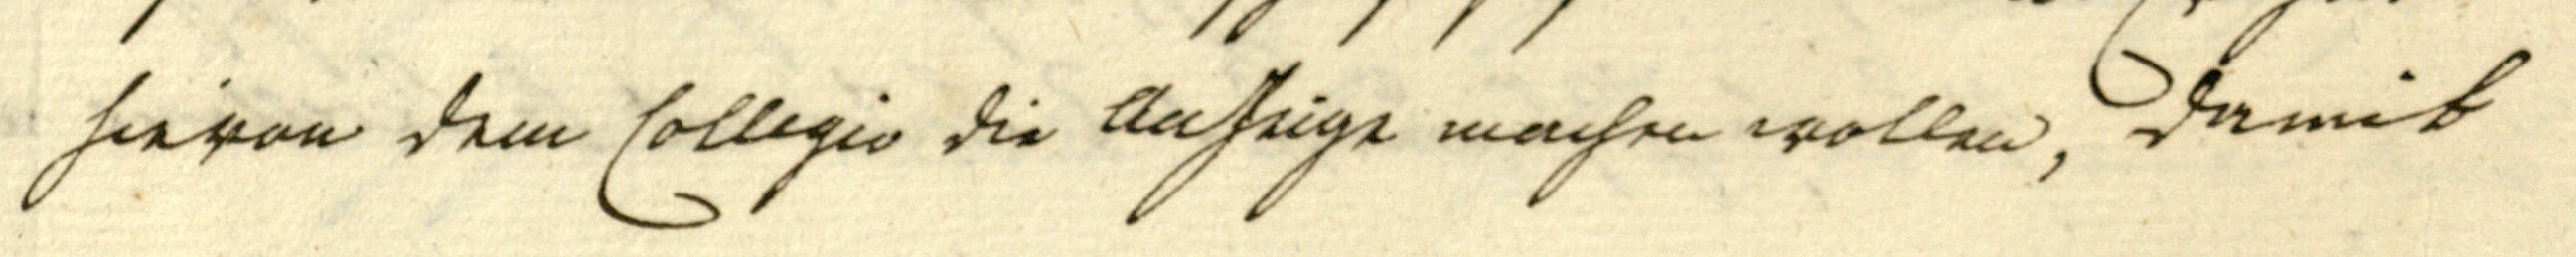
hievon dem Collegio die Anzeige machen wollen, damit
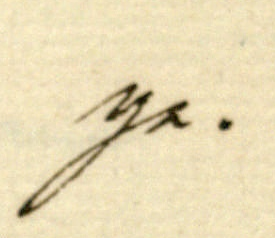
ge
